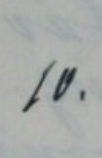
10
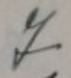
7
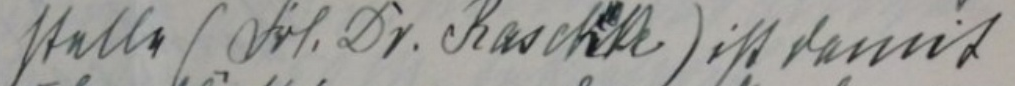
stelle (Frl. Fr. Raschke) ist damit
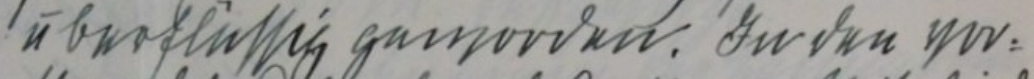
überflüssig geworden. In den Vor
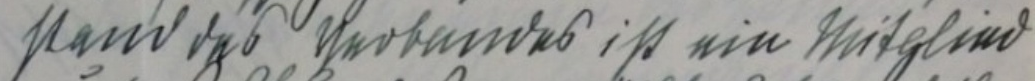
stand des Verbandes ist ein Mitglied
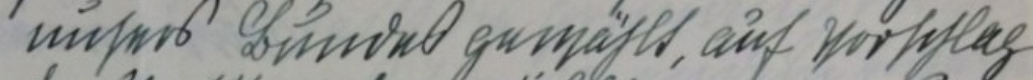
uinseres Bundes gewählt, auf Vorschlag
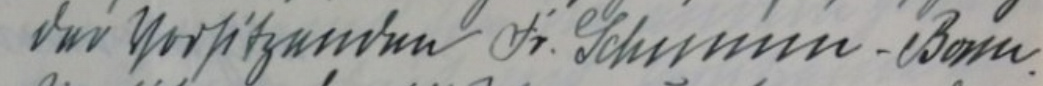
der Vorsitzenden Fr. Schumm - Bonn.
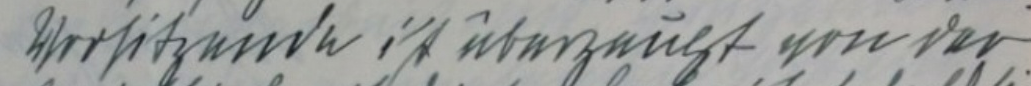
Voristzendene ust überzeugt von der
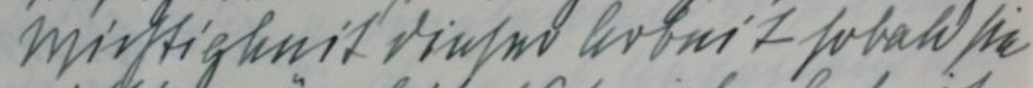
Wichtigkeit dieser Arbeit sobald sie
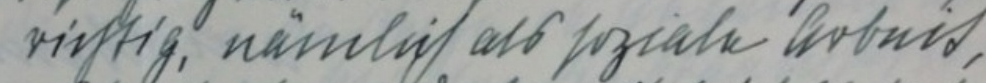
richtig, nämlich als souiale Arbeit
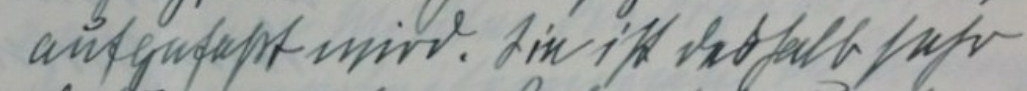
aufgefaßt wird. Die ist deshalb sehr
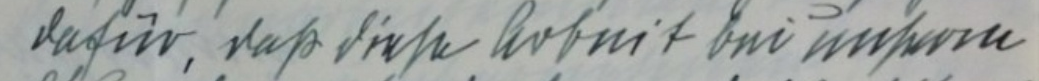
dafür, daß diese Arbeit bei unserem
